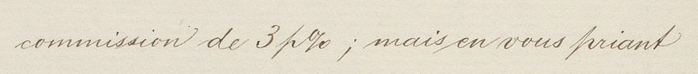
commission de 3 p%; mais en vous priant
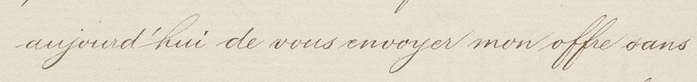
aujourd'hui de vous envoyer mon offre sans
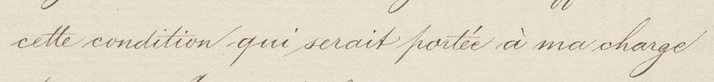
cette condition qui serait portée à ma charge
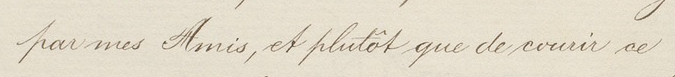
par mes Amis, et plutôt que de courir ce
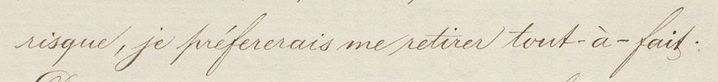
risque, je préfererais me retirer tout-à-fait.
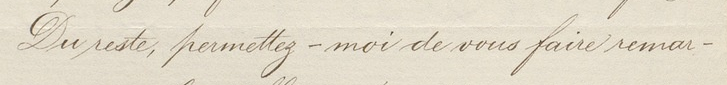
Du reste, permettez-moi de vous faire remar-
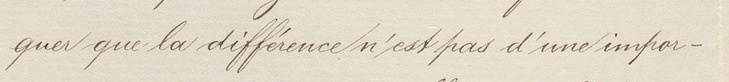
quer que la différence n'est pas d'une impor-
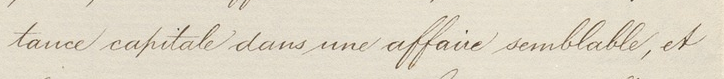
tance capitale dans une affaire semblable, et
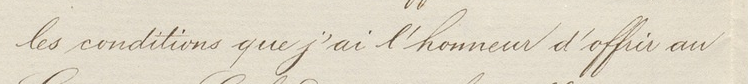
les conditions que j'ai l'honneur d'offrir au
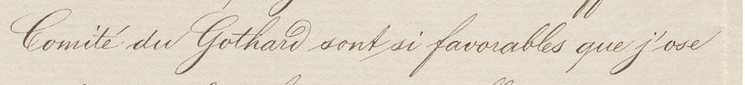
Comité du Gothard sont si favorables que j'ose
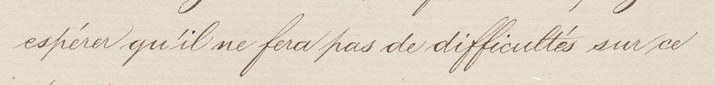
espérer qu'il ne fera pas de difficultés sur ce
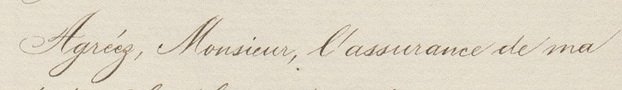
Agréez, Monsieur, l'assurance de ma
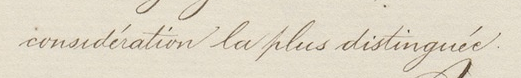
considération la plus distinguée.
